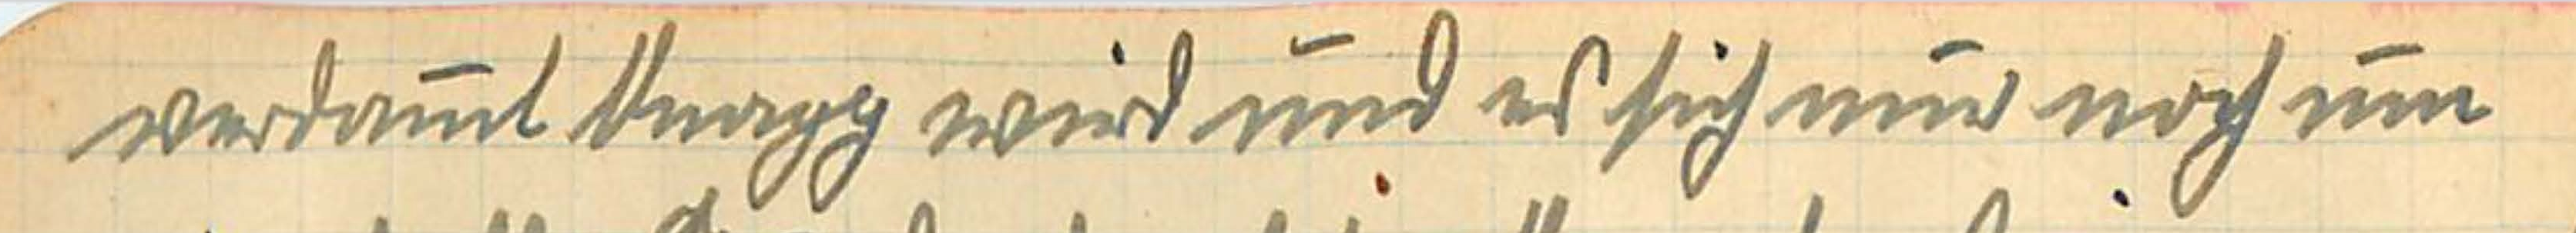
verdammt knapp wird und es sich nur noch um
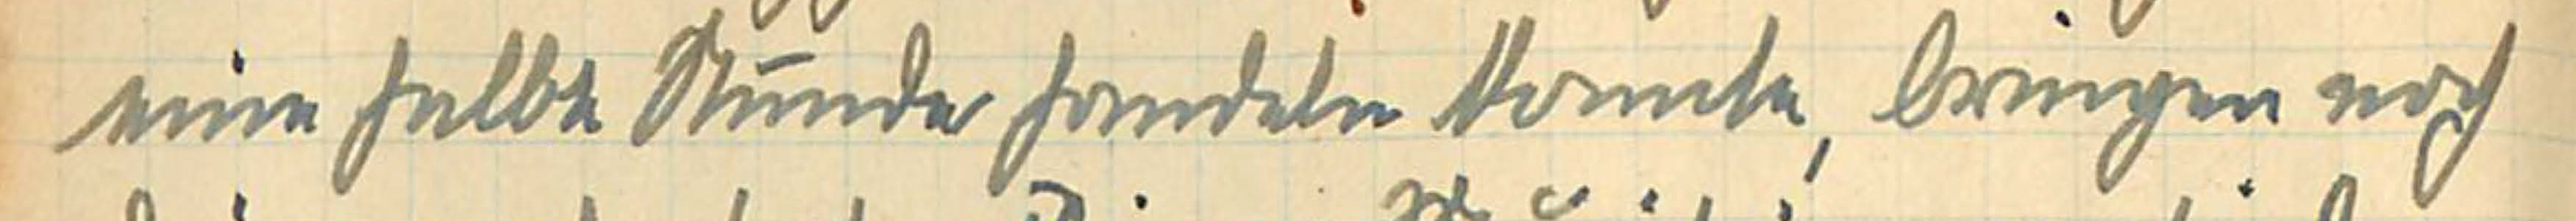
eine halbe Stunde handeln konnte, bringen noch
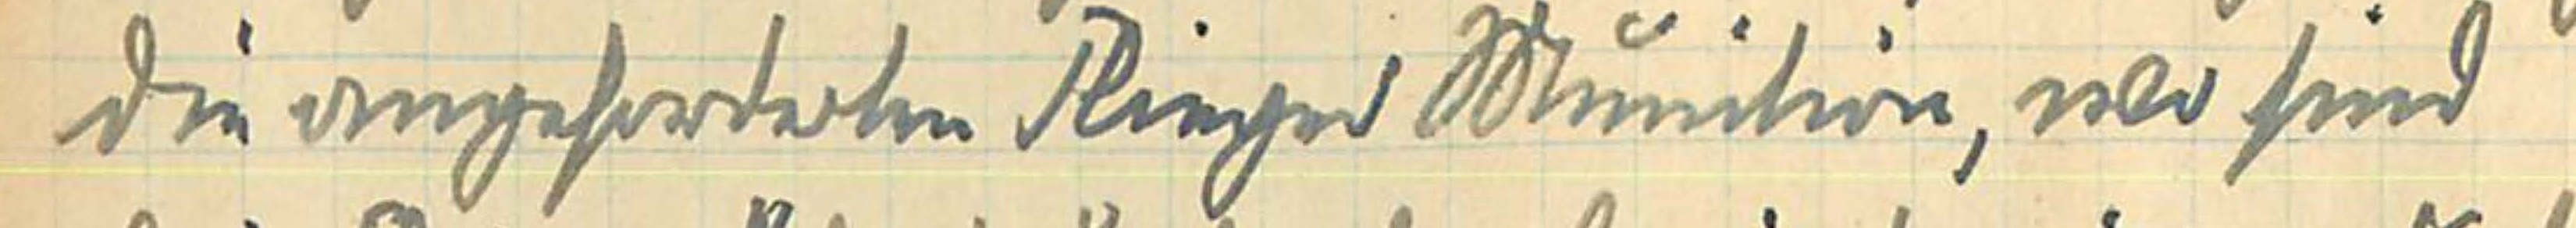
die angeforderten Flieger Munition, wo sind
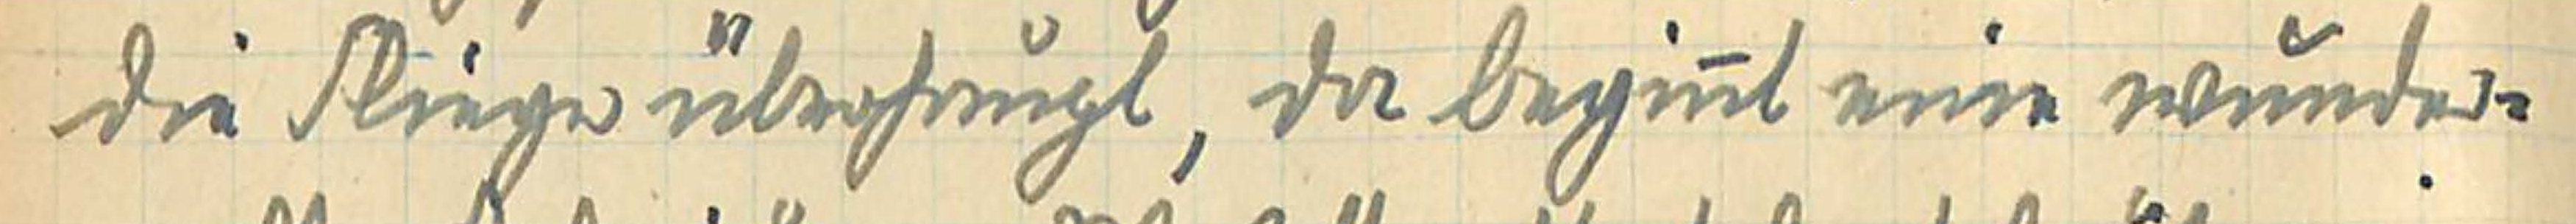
die Flieger überhaupt, da beginnt eine wunder-
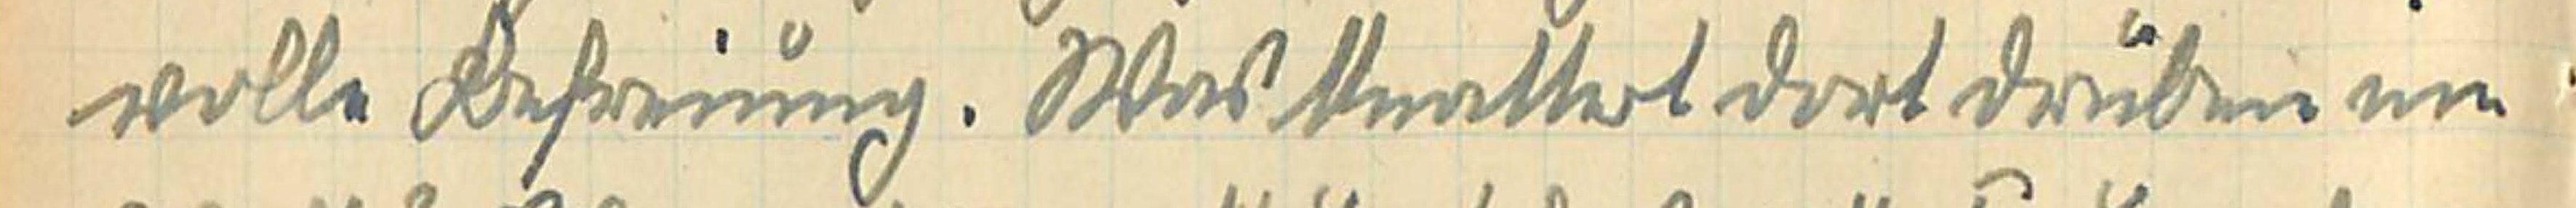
volle Befreiung. Was knattert dort drüben im
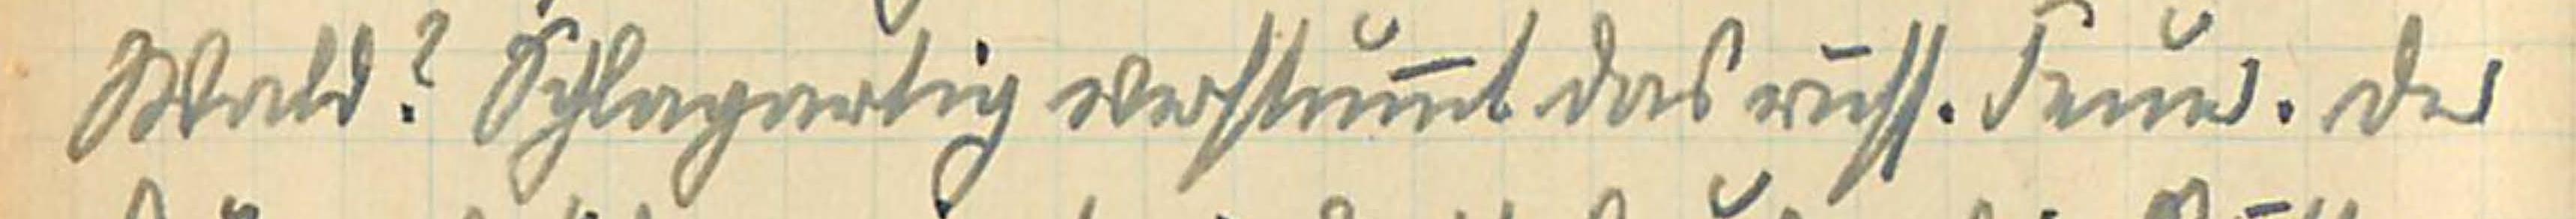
Wald? Schlagartig verstummt das russ. Feuer. Der
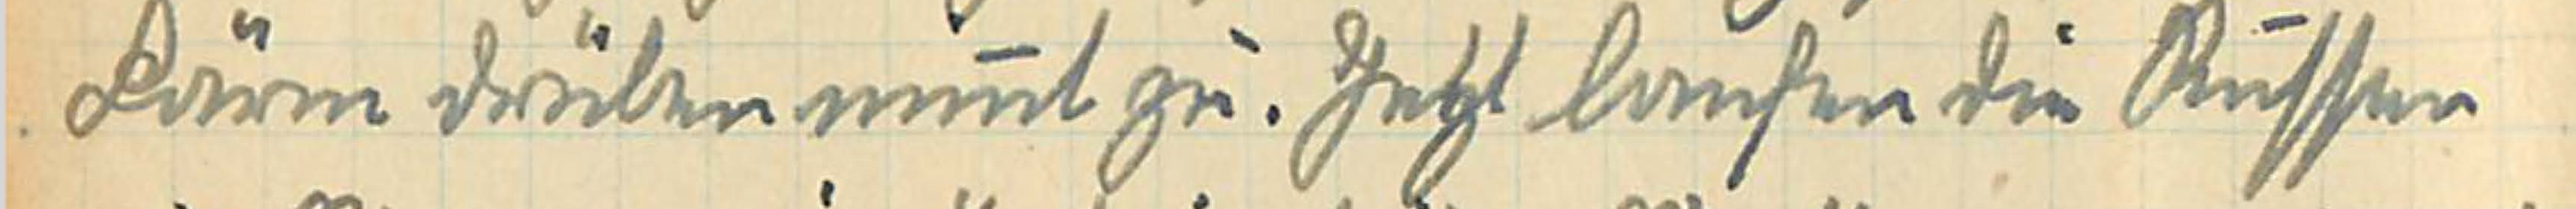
Lärm drüben nimmt zu. Jetzt laufen die Russen
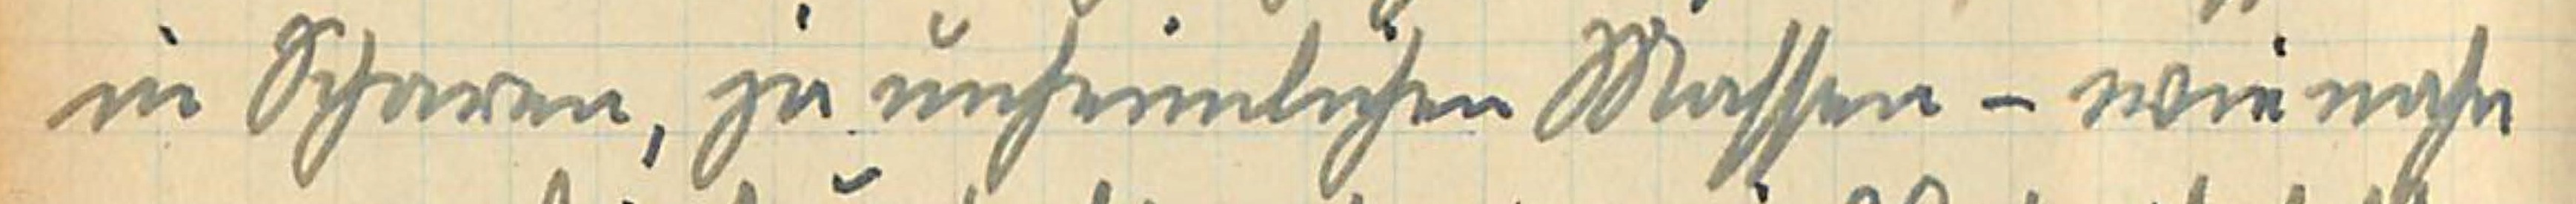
in Scharen, ja unheimlichen Massen – wie nahe
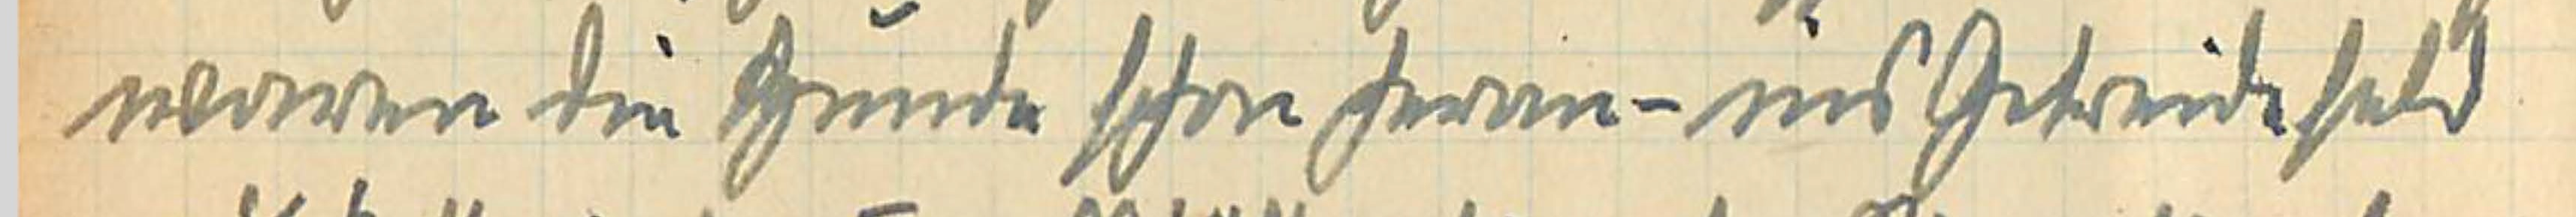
waren die Hunde schon heran – ins Getreidefeld
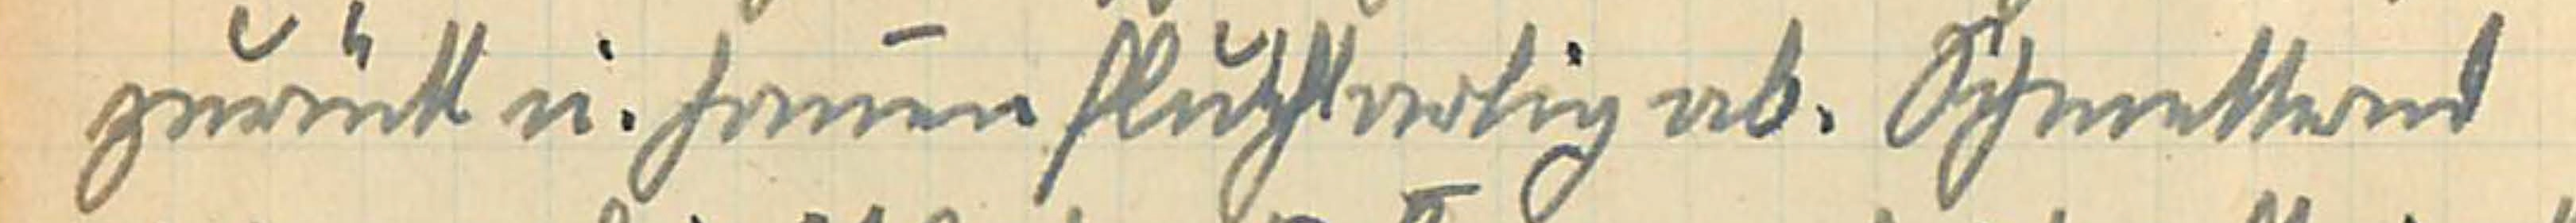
zurück u. hauen fluchtartig ab. Schmetternd
